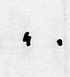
25.
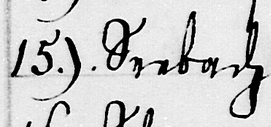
15.) Seebach
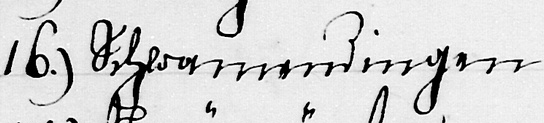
16.) Schwamendingen
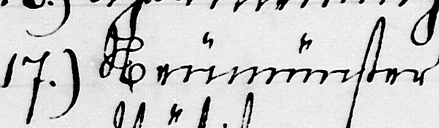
17.) Neumünster
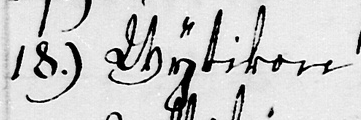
18.) Wytikon
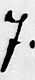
8.
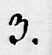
3.
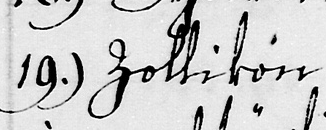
19.) Zollikon
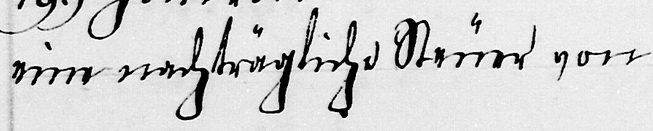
eine nachträgliche Steuer von
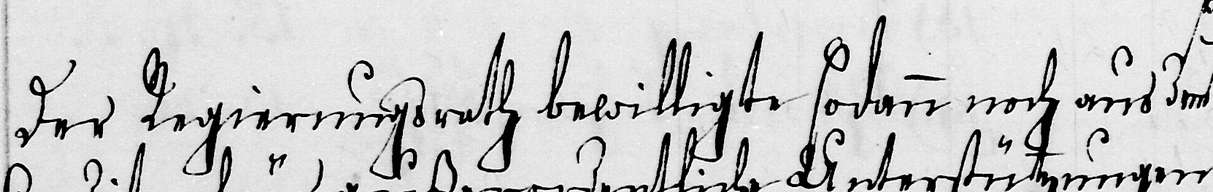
Der Regierungsrath bewilligte sodann noch aus dem
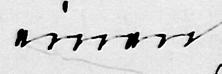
einen
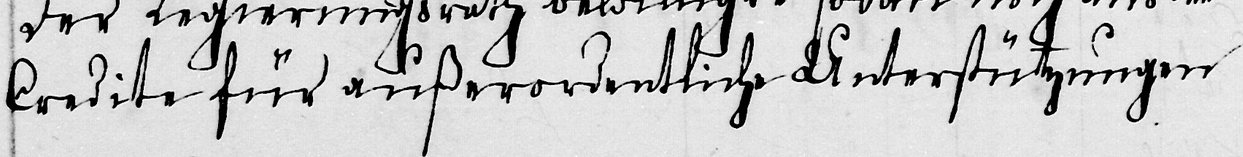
Credite für außerordentliche Unterstützungen
